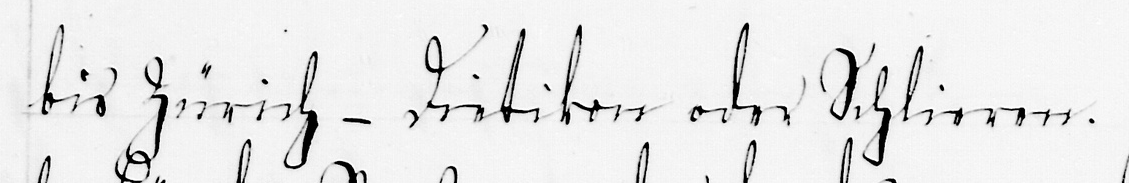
bis Zürich–Dietikon oder Schlieren.
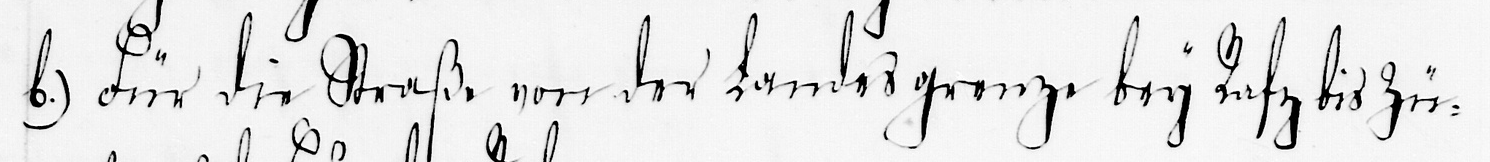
b.) Für die Straße von der Landesgrenze bey Rafz bis Zür¬
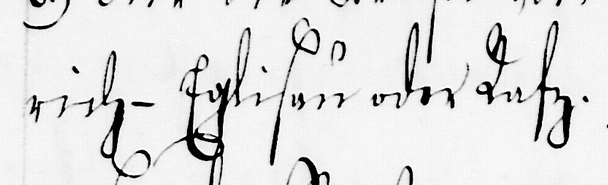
ich–Eglisau oder Raf¬
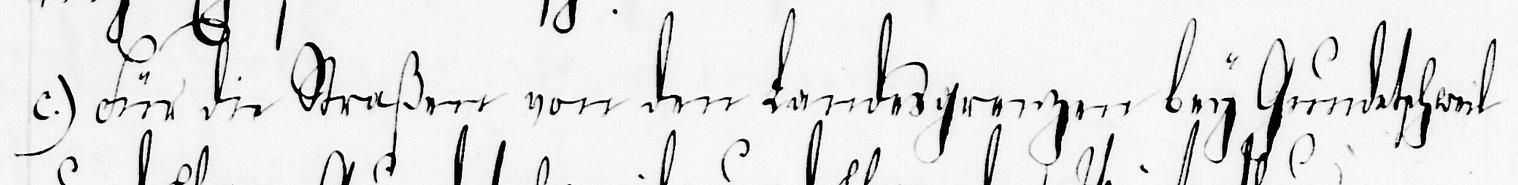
c.) Für die Straßen von den Landesgrenzen bey Gundetschweil
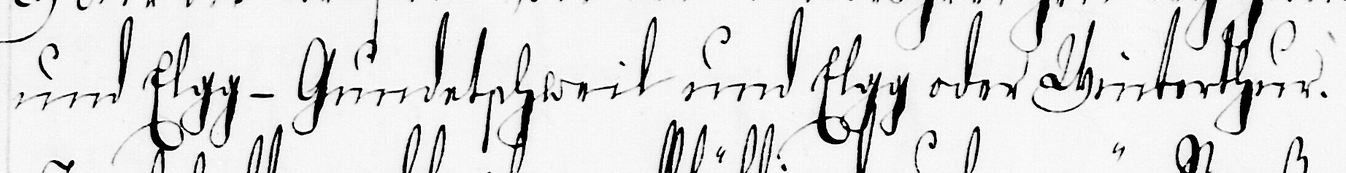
und Elgg–Gundetschweil und Elgg oder Winterthur.
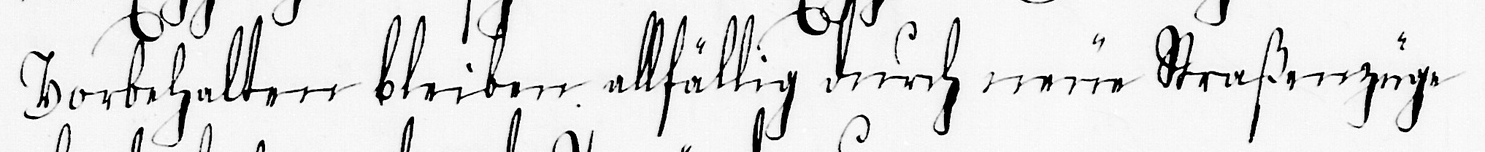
Vorbehalten bleiben allfällig durch neue Straßenzüge
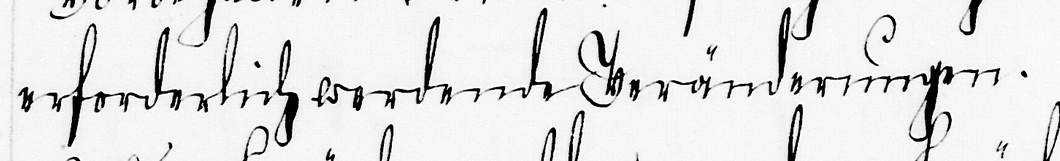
erforderlich werdende Veränderungen.
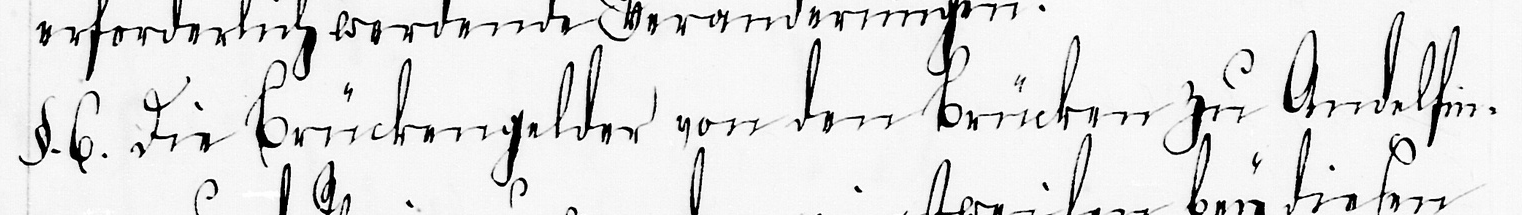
§. 6. Die Brückengelder von den Brücken zu Andelfin¬
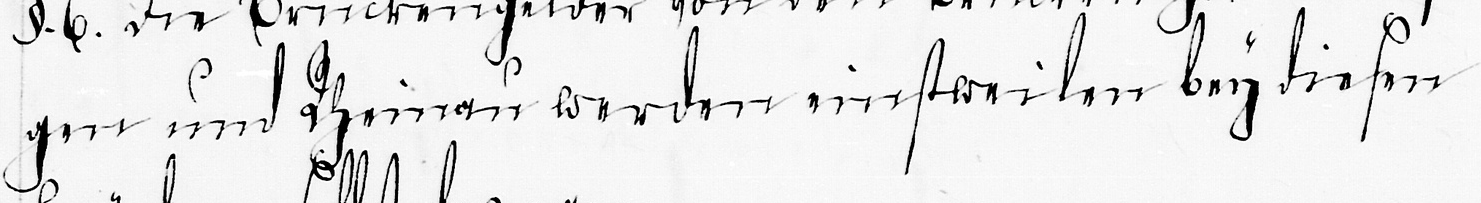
gen und Rheinau werden einstweilen bey diesen
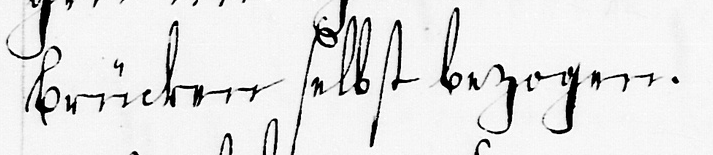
Brücken selbst bezogen.
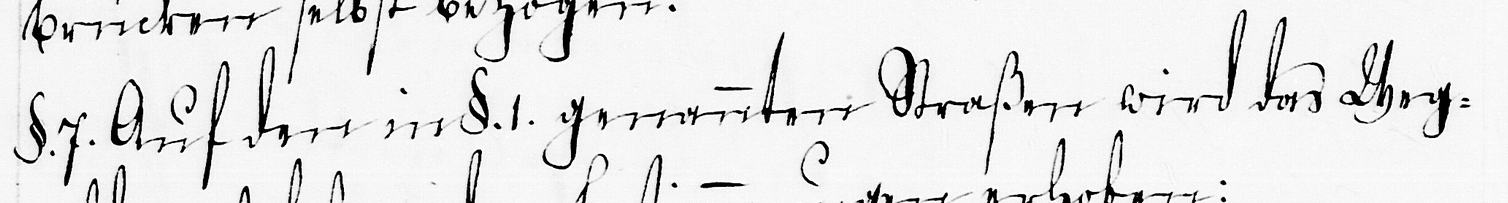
§. 7. Auf den in §. 1. genannten Straßen wird das Weg¬
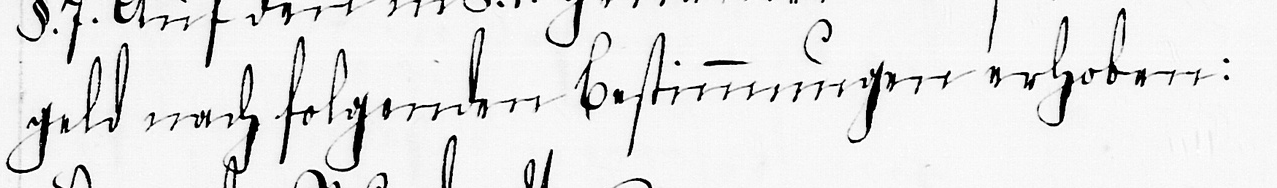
geld nach folgenden Bestimmungen erhoben:
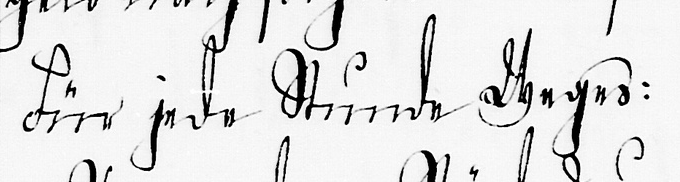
Für jede Stunde Weges:
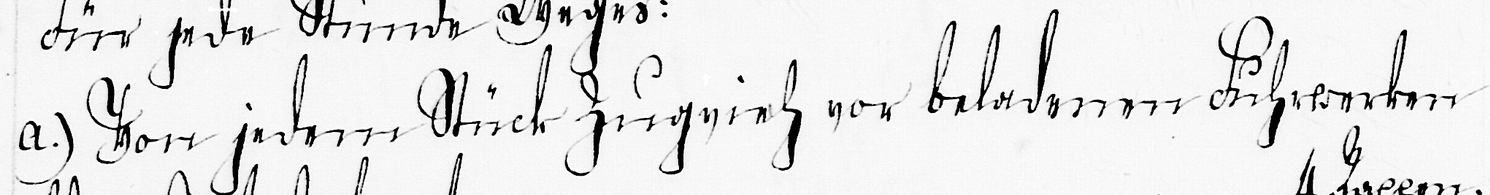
a.) Von jedem Stück Zugvieh vor beladenen Fuhrwerken
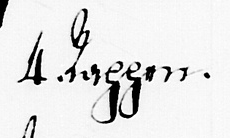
4. Rappen.
